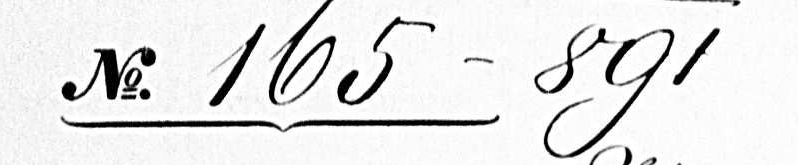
No. 165 – 1891
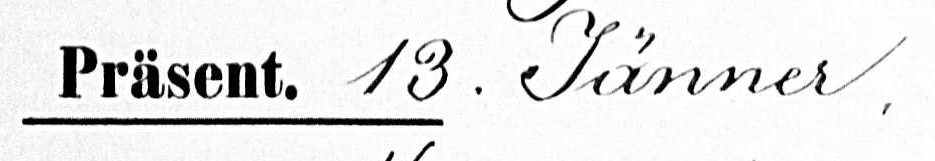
Präsent. 13 Jänner
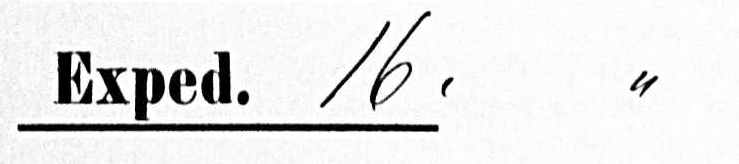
Expedit 16. Jänner
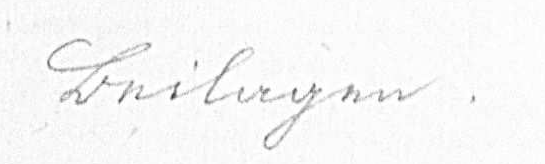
Beilagen
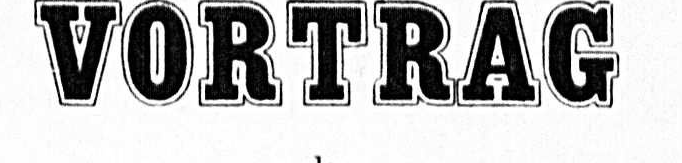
VORTRAG
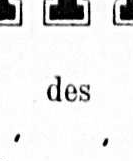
des
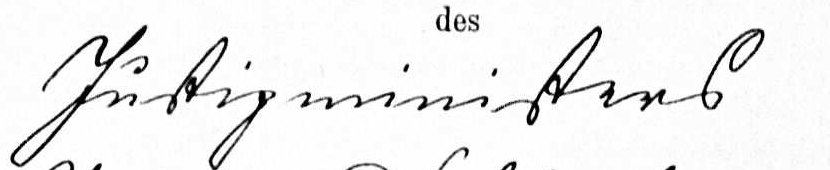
Justizministers
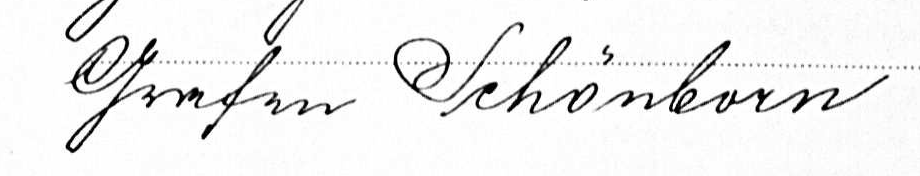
Grafen Schönborn
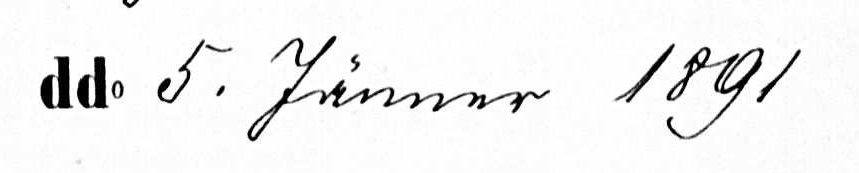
Ddo 5 Jänner 1891
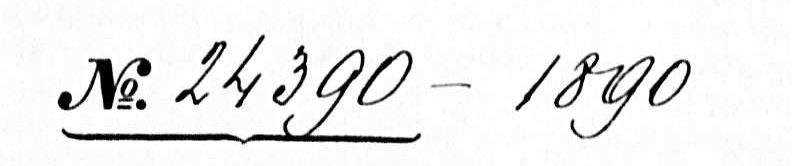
No 24390 – 1890
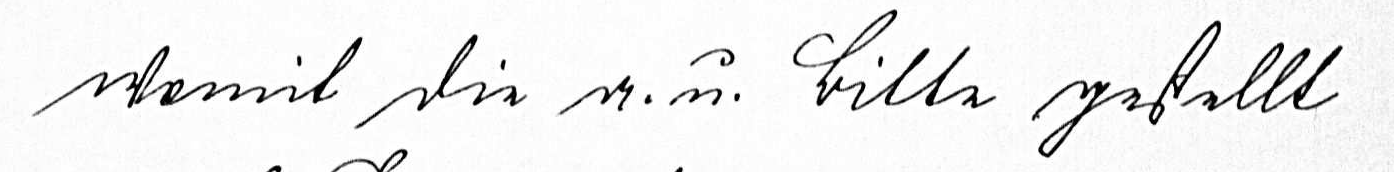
Womit die a. u. Bitte gestellt
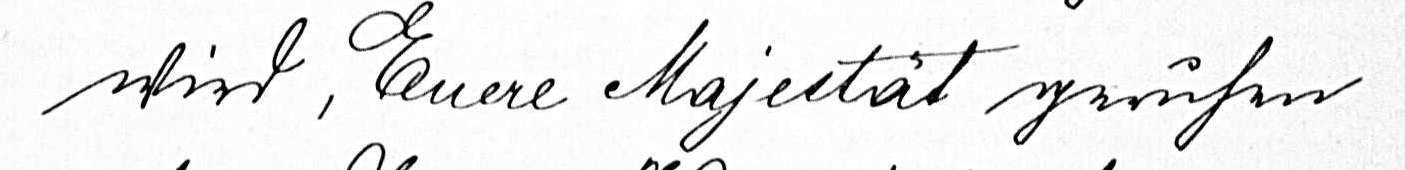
wird, Euere Majestät geruhen
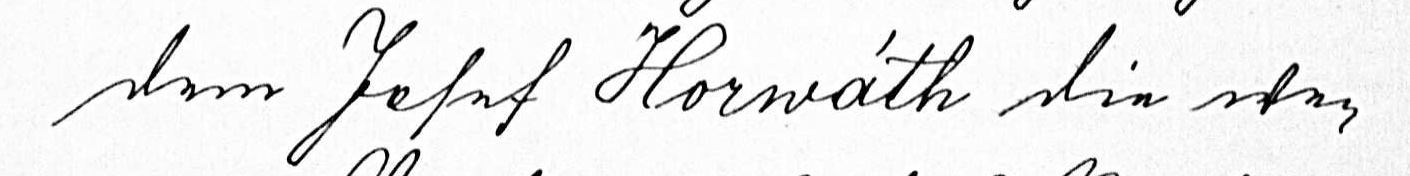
dem Josef Horwáth die we¬
